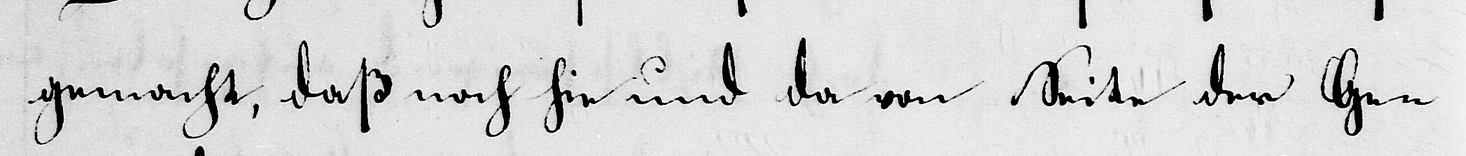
gemacht, daß noch hie und da von Seite der Ge¬
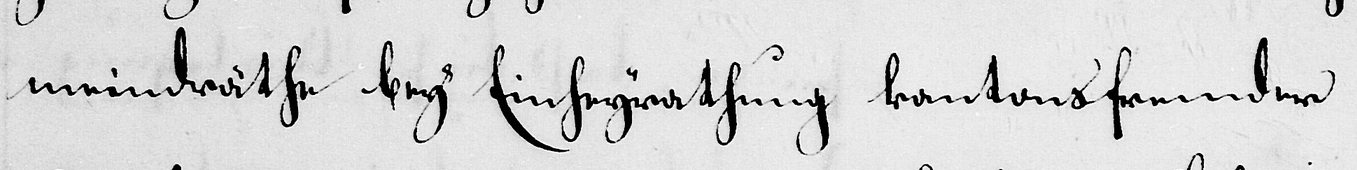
meindräthe bey Einheyrathung kantonsfremder
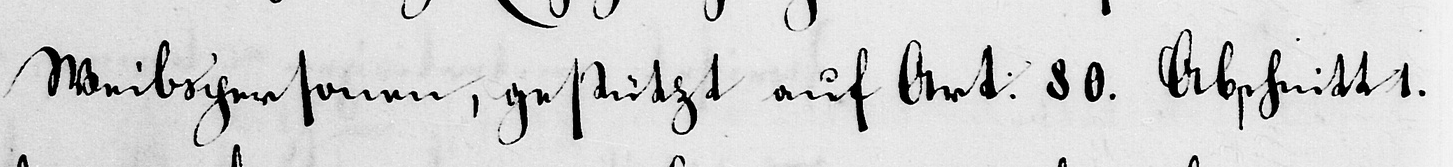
Weibspersonen, gestützt auf Art. 80. Abschnitt 1.
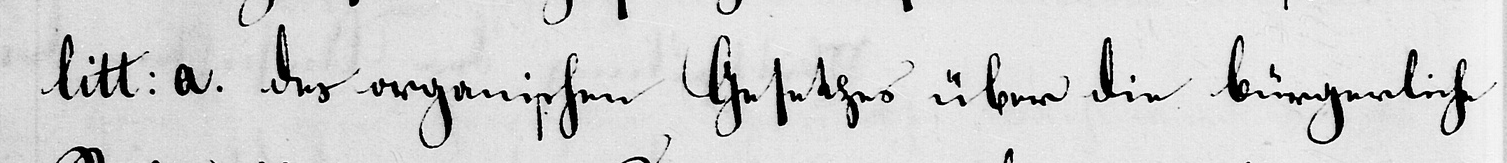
litt: a. des organischen Gesetzes über die bürgerliche
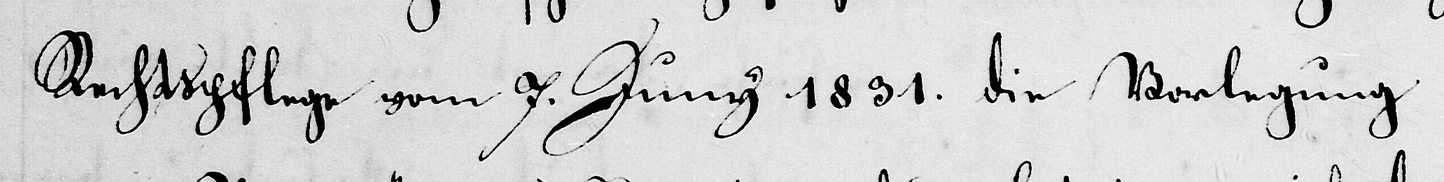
Rechtspflege vom 7. Juny 1831. die Verlegung
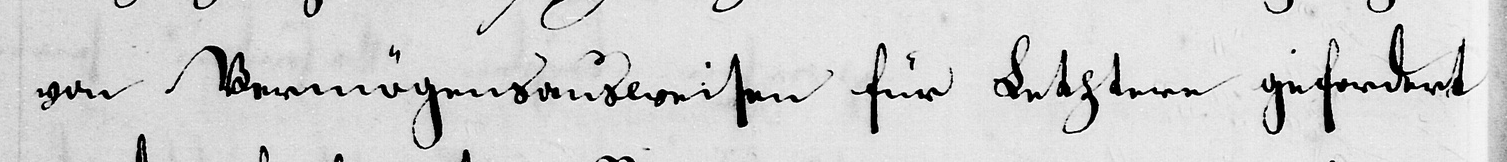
von Vermögensausweisen für Letztere gefordert
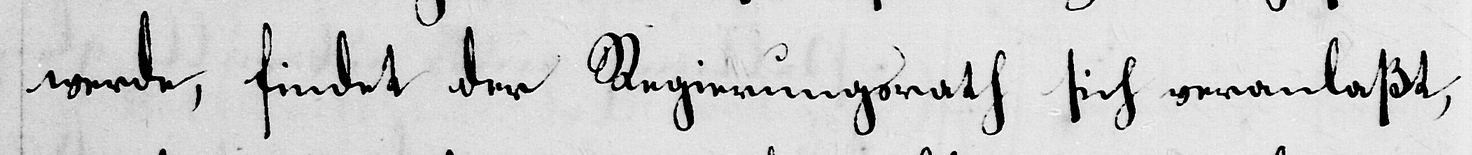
werde, findet der Regierungsrath sich veranlaßt,
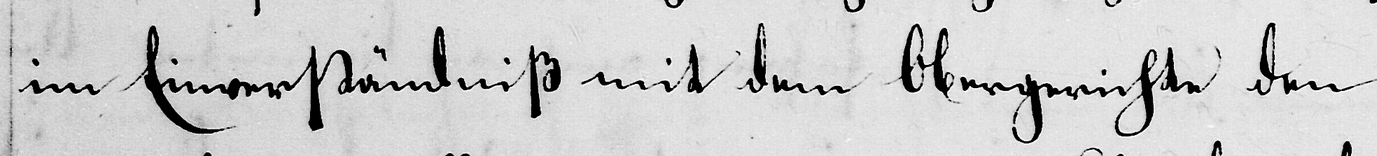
im Einverständniß mit dem Obergerichte den
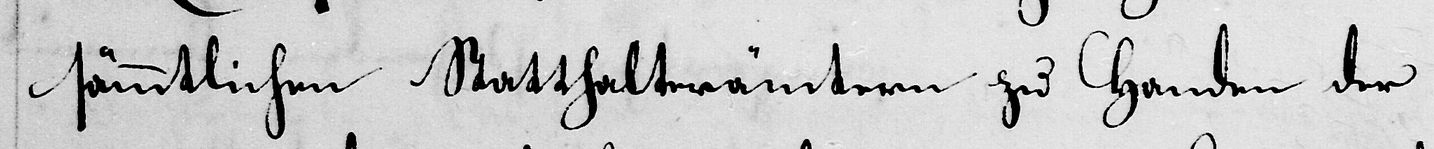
sämmtlichen Statthalterämtern zu Handen der
